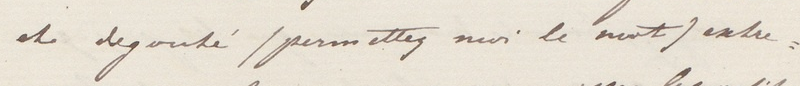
et degouté (permettez moi le mot) extre-
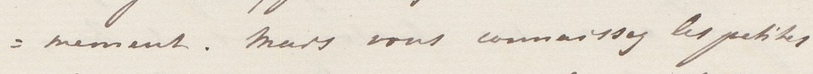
mement. Mais vous connaissez les petites
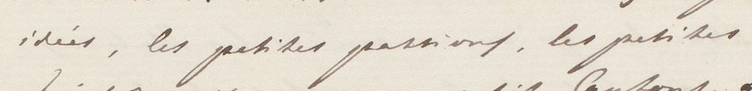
idées, les petites passions, les petites
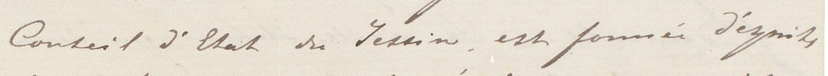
Conseil d'Etat du Tessin est formée d'esprits
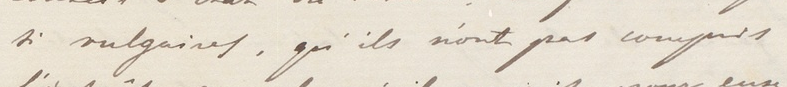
si vulgaires, qu'ils n'ont pas compris
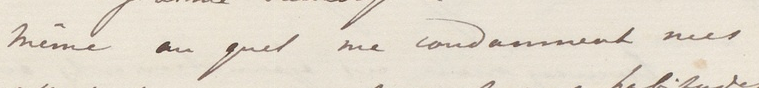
même au quel me condamnent mes
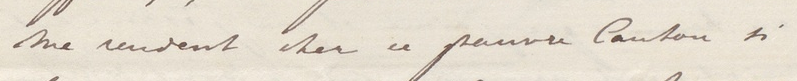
me rendent chez ce pauvre Canton si
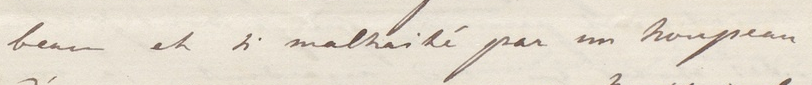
beau et si maltraité par un troupeau
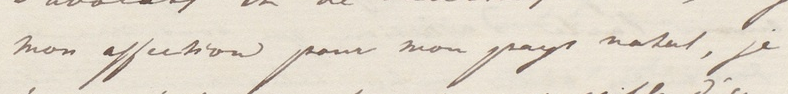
mon affection pour mon pays natal, je
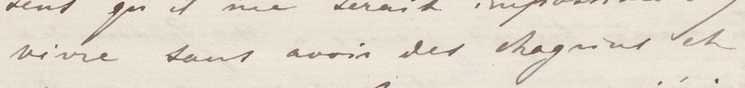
vivre sans avoir des chagrins et
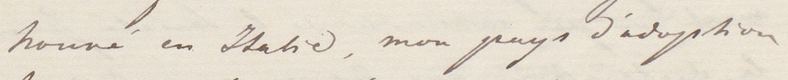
trouvé en Italie, mon pays d'adoption,
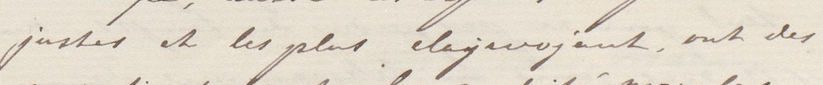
justes et les plus clayrvojant, ont des
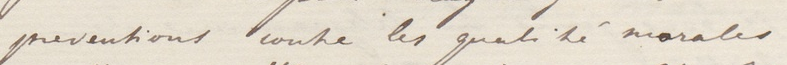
preventions contre les qualité morales
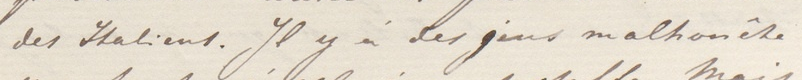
des Italiens. Il y a des gens malhonête
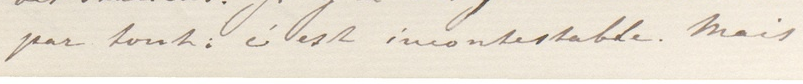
par tout: c'est incontestable. Mais
